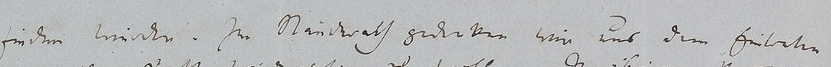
finden würden. Im Ständerath gedenken wir uns dem Eintreten
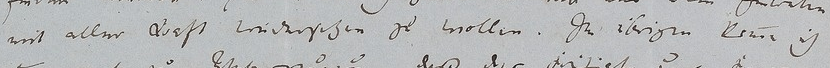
mit aller Kraft widersetzen zu wollen. Im übrigen komme ich
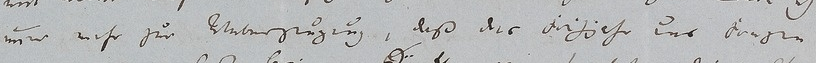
immer mehr zur Ueberzeugung, daß das Frühjahr uns Fragen
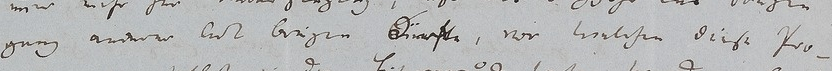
ganz anderer Art bringen dürfte, vor welchen diese Pro-
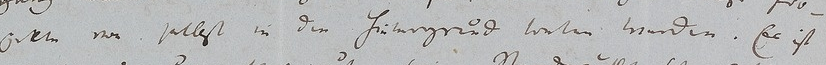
jekte von selbst in den Hintergrund treten werden. Es ist
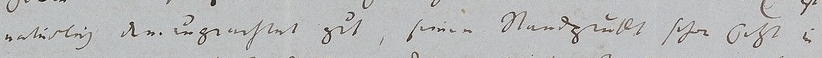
natürlich dem ungeachtet gut, seinen Standpunkt schon jetzt in
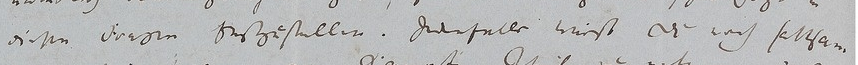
diesen Fragen festzustellen. Jedenfalls wirst Du noch sattsam
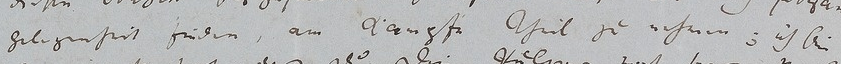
Gelegenheit finden, am Kampfe Theil zu nehmen; ich bin
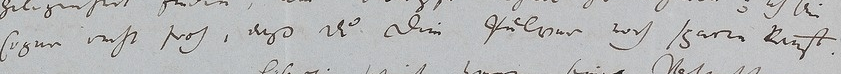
sogar recht froh, daß Du Dein Pulver noch sparen kannst.
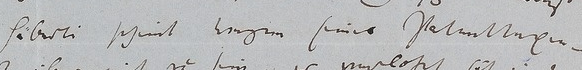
Häberli scheint wegen seines Patenttaxen-
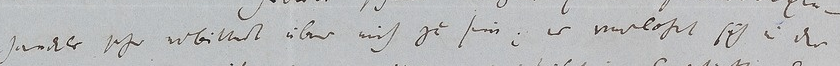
handels sehr verbittert über mich zu sein; es verlohnt sich in der
